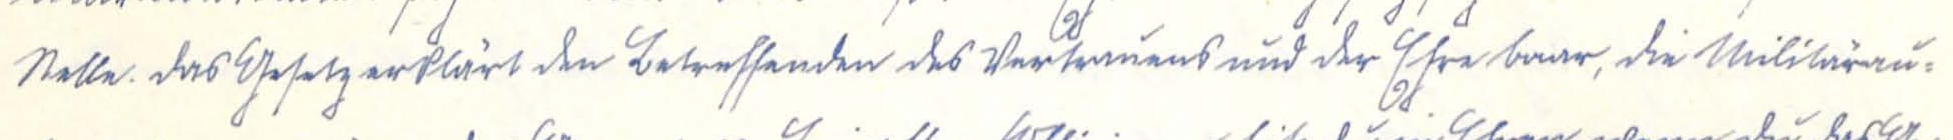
Stelle. Das Gesetz erklärt den Betreffenden des Vertrauens und der Ehre bare, die Militärau-
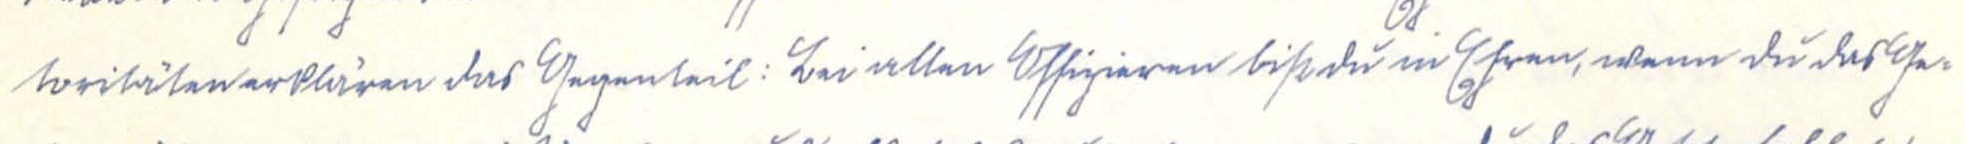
toritäten erklären das Gegenteil: Bei allen Offizieren bist du in Ehren, wenn du das Ge-
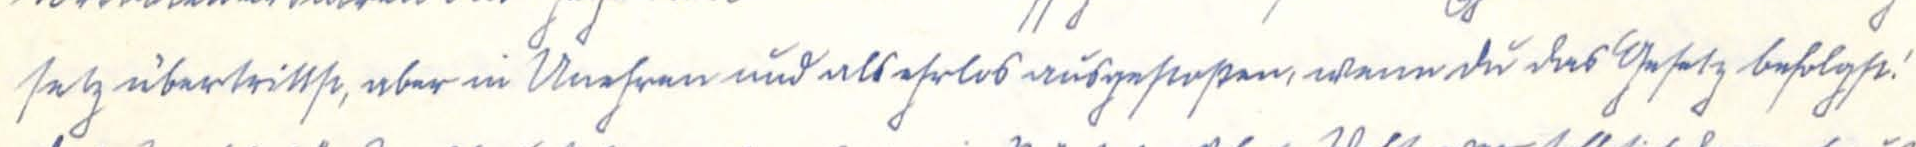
setz übertrittst, aber in Unehren und als ehrelos ausgestoßen, wenn du das Gesetz befolgst!
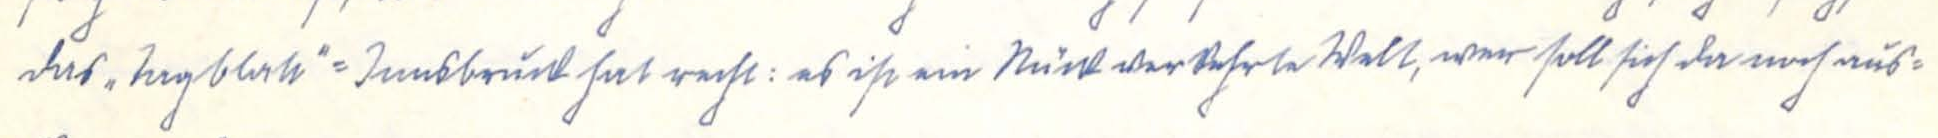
Das „Tagblatt" - Innsbruck hat recht: Es ist ein Stück verkehrte Welt, wer soll sich da noch aus-
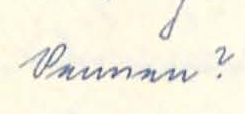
kennen ?
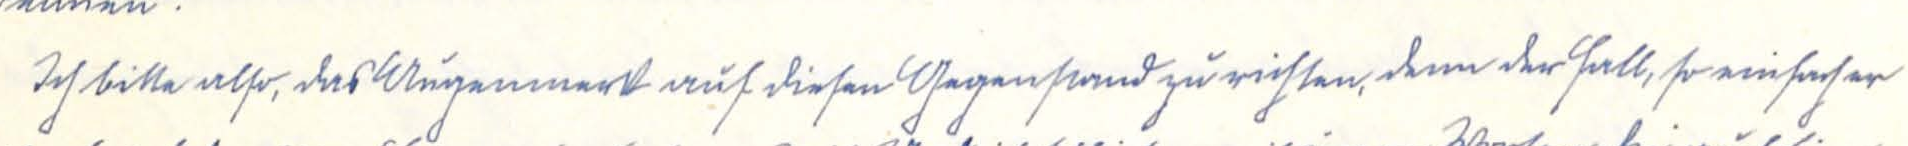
Ich bitte also, das Augenmerk auf diesen Gegenstand zu richten denn der Fall, so einfach er
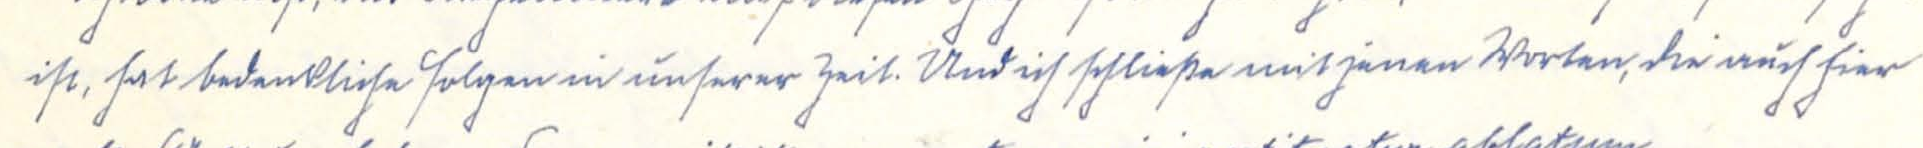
ist, hat bedenkliche Folgen in unserer Zeit. Und ich schließe mit jenen Worten, die auch hier
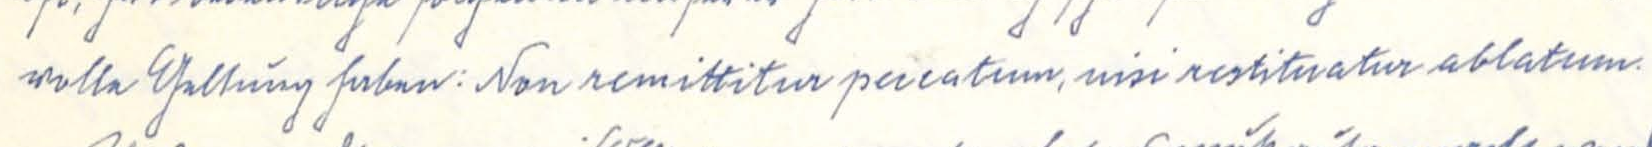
volle Geltung haben: Non remittitur peicatum, nisi restituatur ablatum.
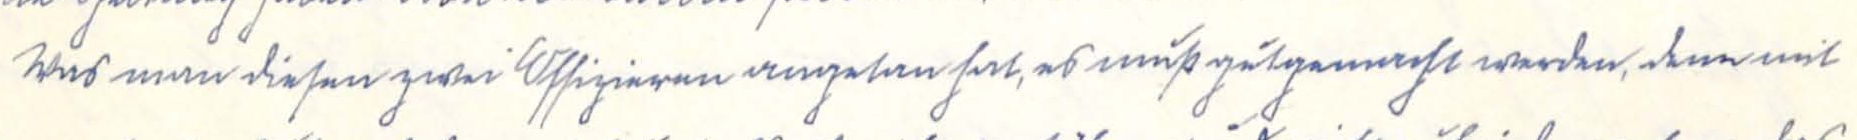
Was man diesen zwei Offizieren angetan hat, es muss gutgemacht werden, denn mit
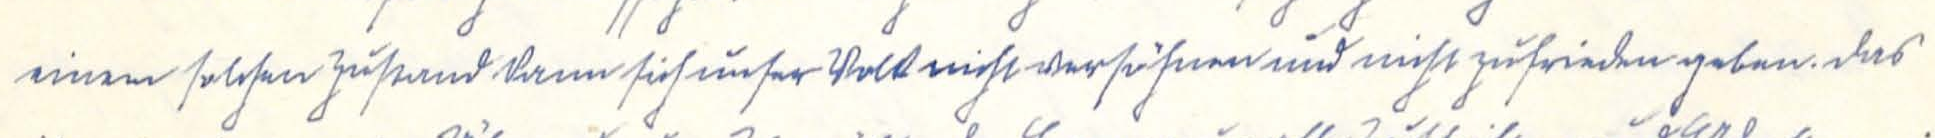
einem solchen Zustand kann sich unser Volk nicht versöhnen und nicht zufrieden geben. Das
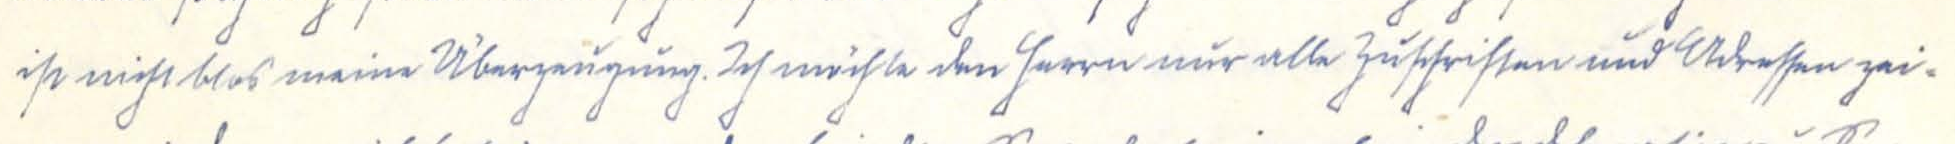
ist nicht blos meine Überzeugung. Ich möchte den Herrn nur alle Zuschriften und Adressen zei-
